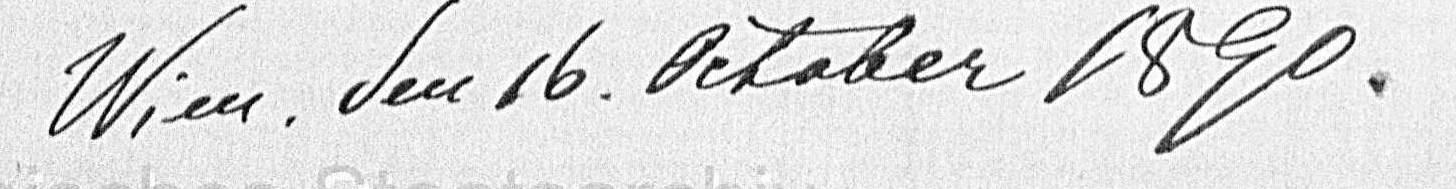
Wien, den 16. October 1890.
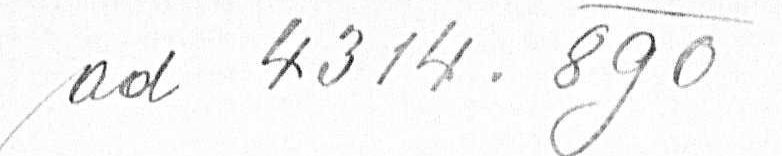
ad 4314. 890
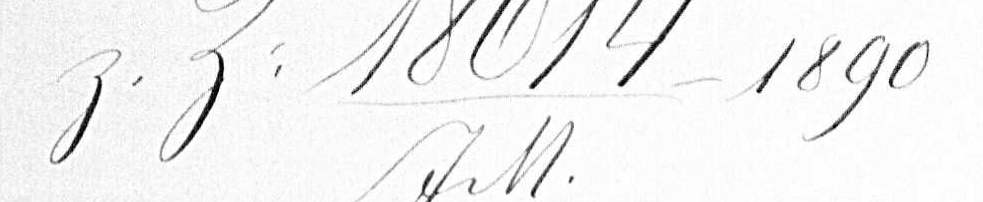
z. Z: 18614 - 1890
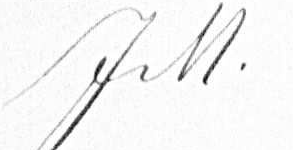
J M.
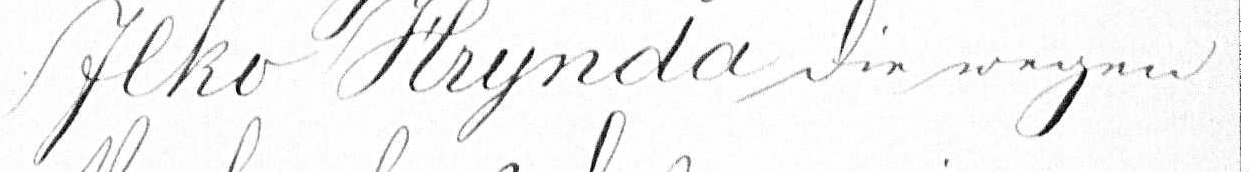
Jlko Hrynda die wegen
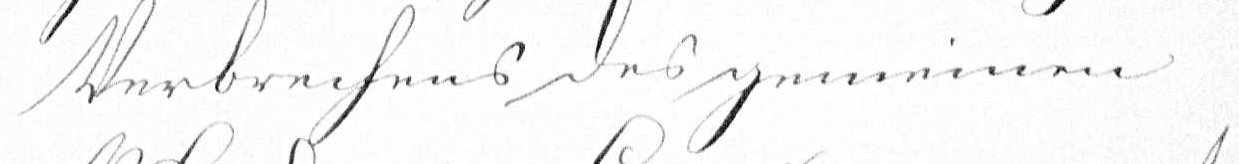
Verrechens des gemeinen
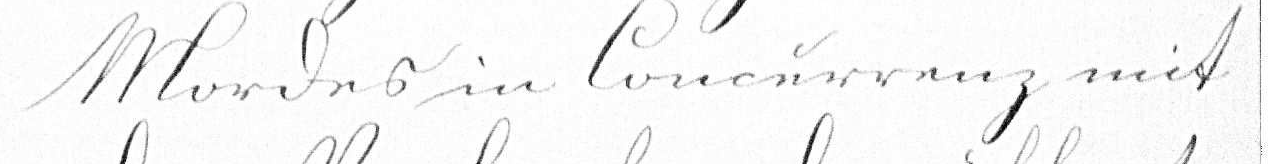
Mordes in Cocurrenz mit
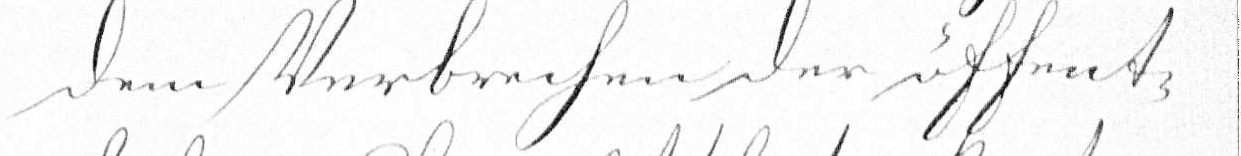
dem Verbrechen der öffent¬
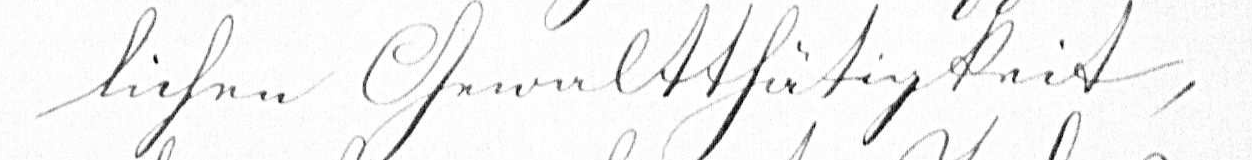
lichen Gewaltthätigkeit,
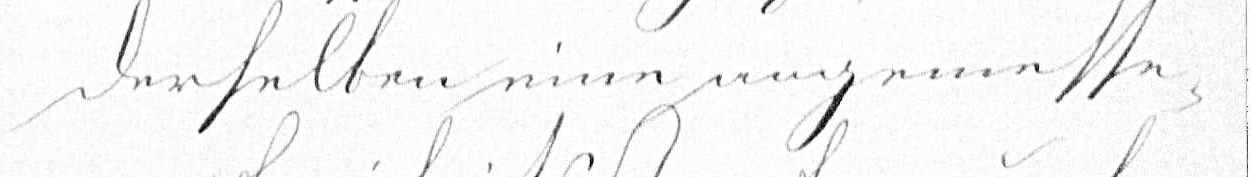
derselen eine angemesse¬
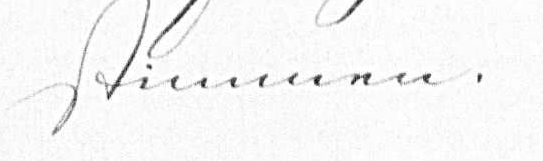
stimmen.
